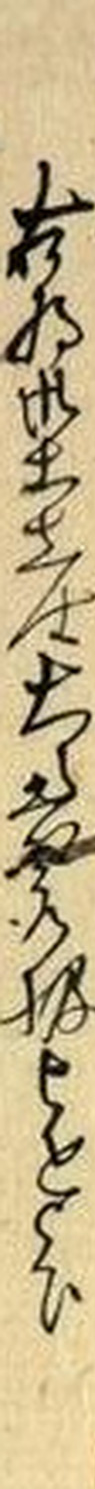右為御土産大奥取扱被進之候
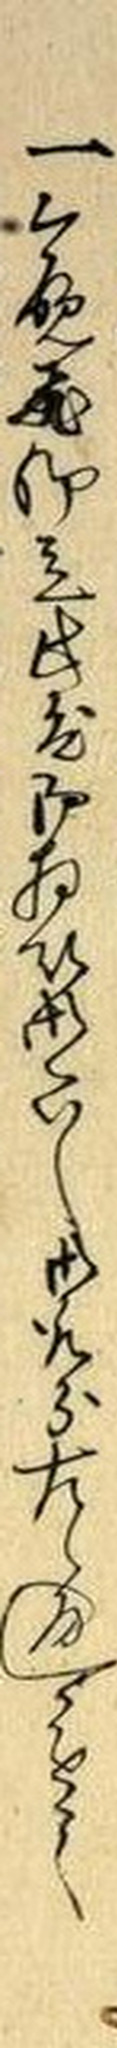一今晩飛脚立此度御拝領御くハし御取分左之通被進之
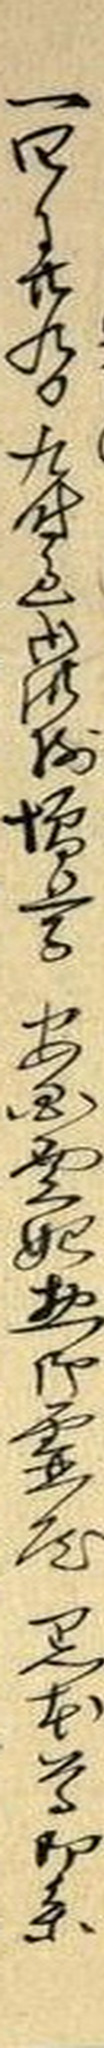一四月廿九日九時過御供揃増上寺安国殿始惣御霊屋黒本尊御参
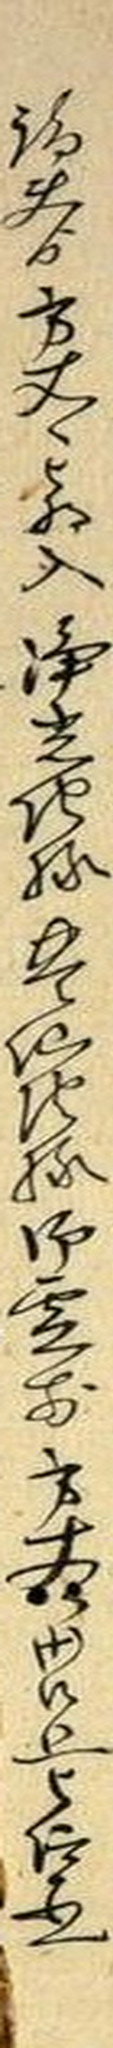詣夫ゟ方丈へ被為入浄光院様豊仙院様御霊前方丈へ御口上被仰置
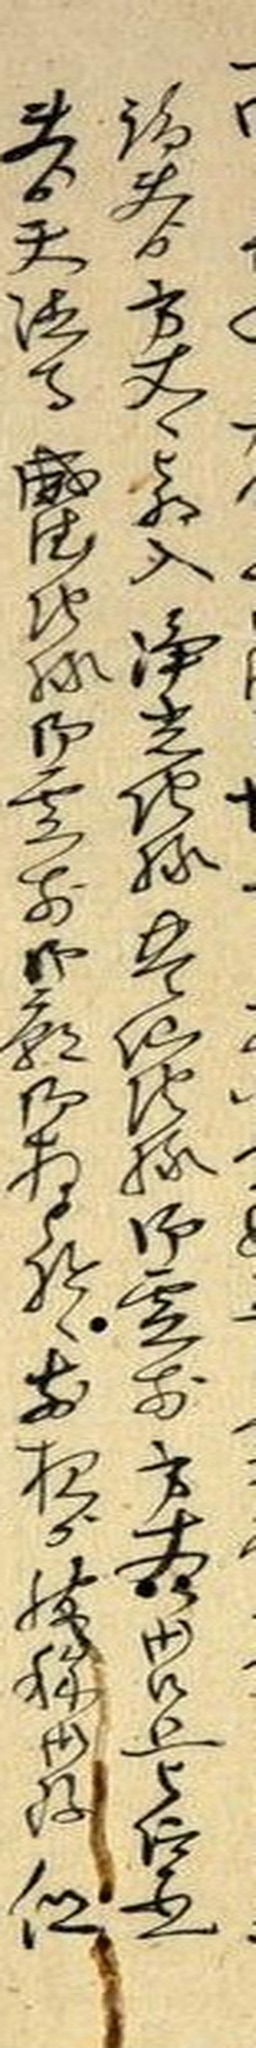夫ゟ天徳寺威徳院様御霊前御廟御拝被遊候前夜ゟ服穢御改但
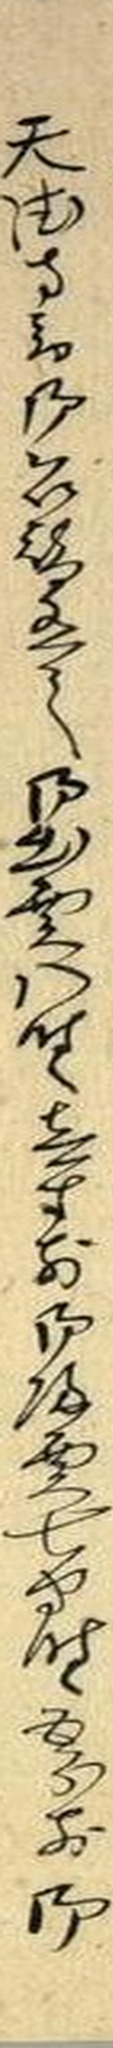天徳寺ニ而御召替有之御出殿八時へ壱寸前御帰殿七半時へ五分前御
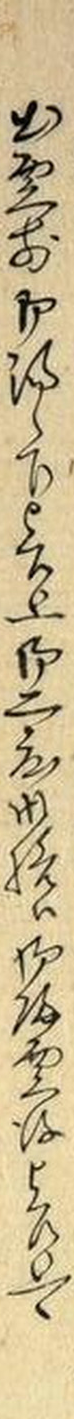出殿前御湯之下迄被召上御二度御膳ハ御帰殿後被召上候

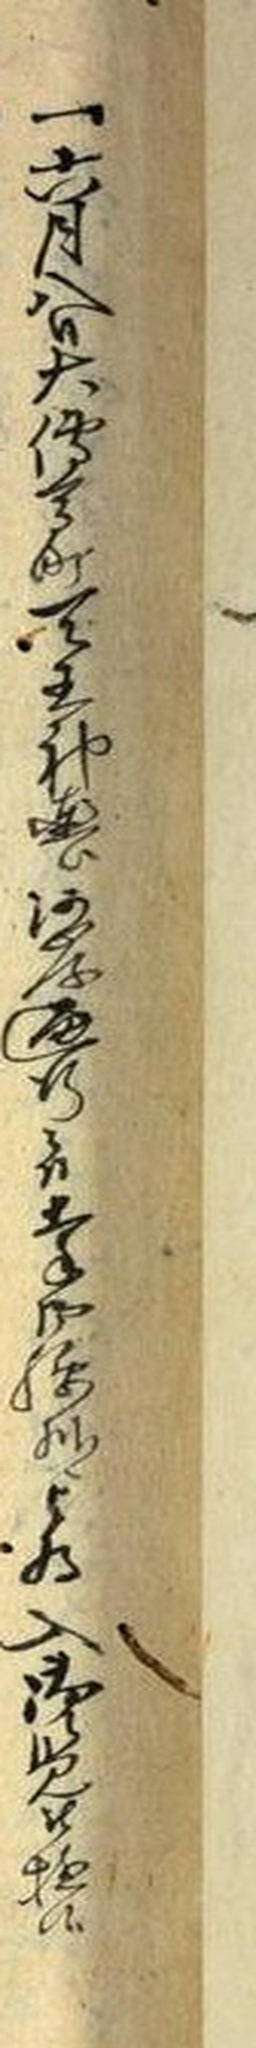一六月八日大伝馬町天王神輿河岸通行ニ付土手御腰掛へ被為入御覧被遊候
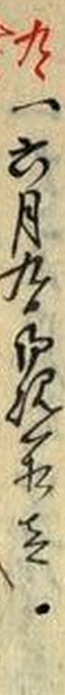一六月九日御硯箱壱
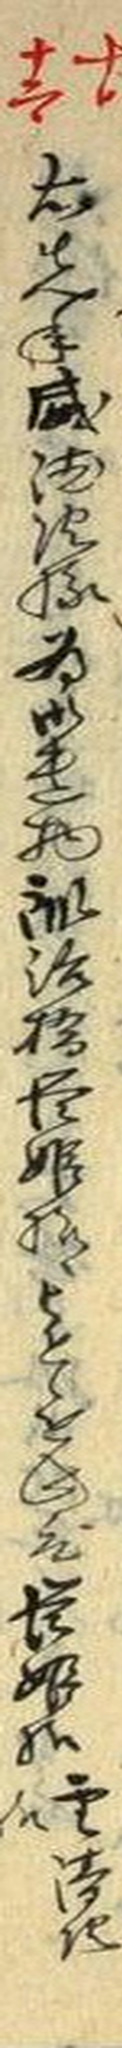右先年威徳院様為御遣物鍛冶橋従姫様へ被進候を此度従姫様霊清院様
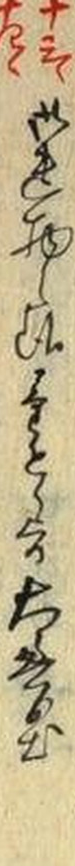御遺物之趣ニ而被進候旨大奥ゟ出
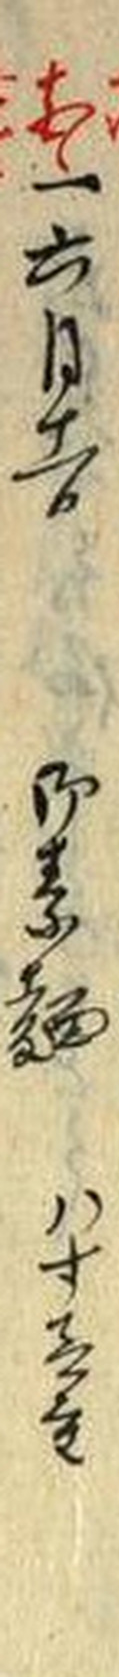一六月十一日御素麺八寸壱重
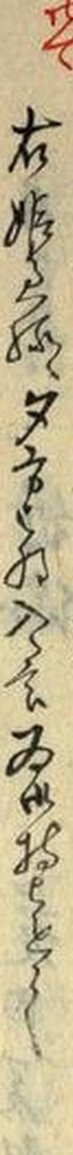右姫君様へ夕方被為入候節為御持被進之
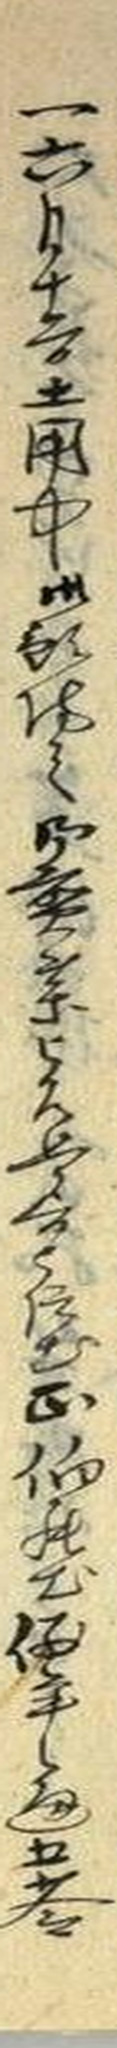一六月十二日土用中御予防之御煎薬被召上候旨被仰出正伯罷出例年之通五苓
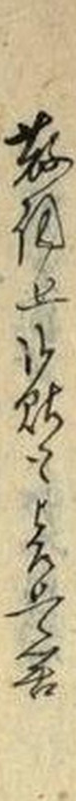散伺上弐貼ツヽ被召上候筈
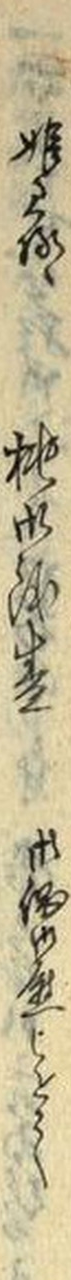姫君様へ桃御鉢盛御側御慰被進之
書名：少傅日録抄（斉承付側向頭取日記、在府）
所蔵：福井県文書館 Fukui Prefectural Archives
